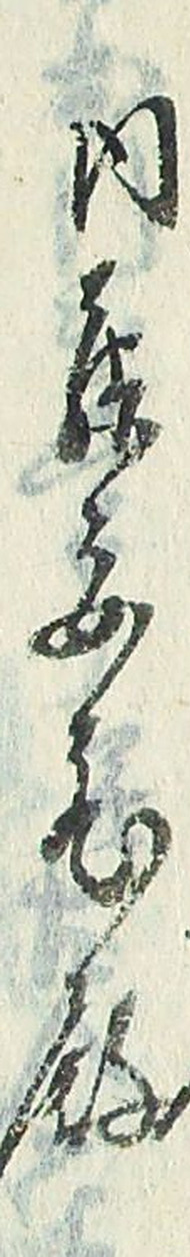内藤安蔵殿

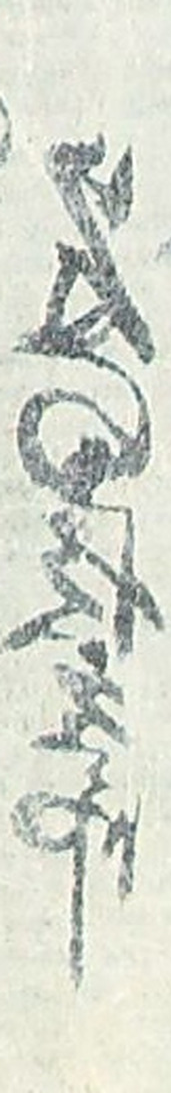十一月廿五日
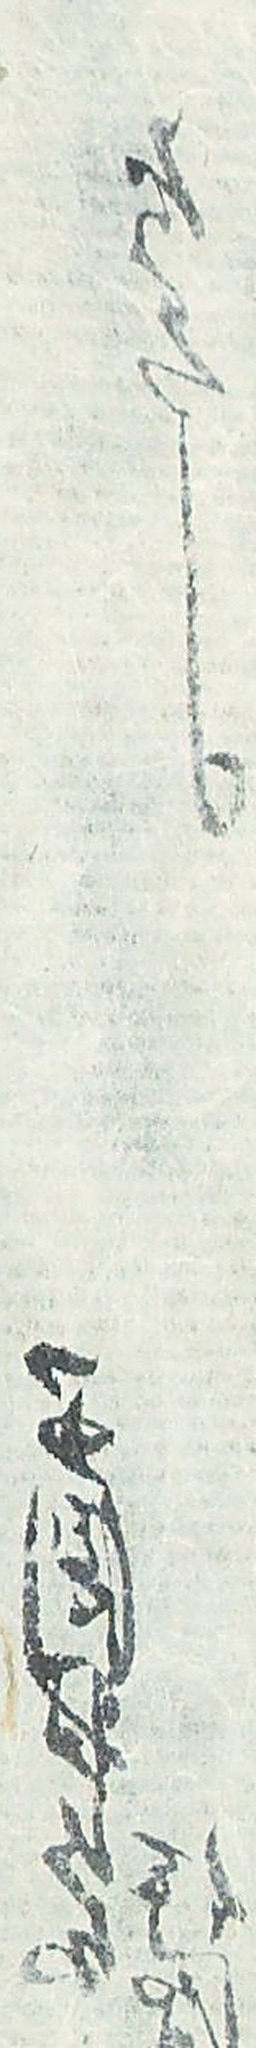十一月廿五日
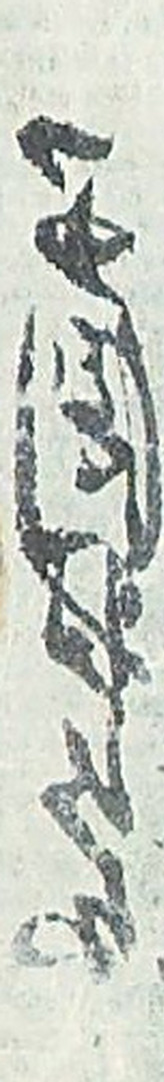十一月廿五日
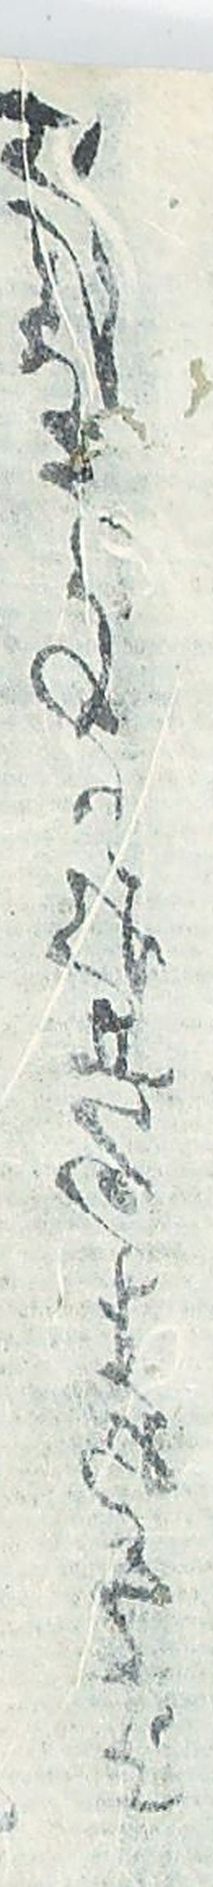十一月廿五日
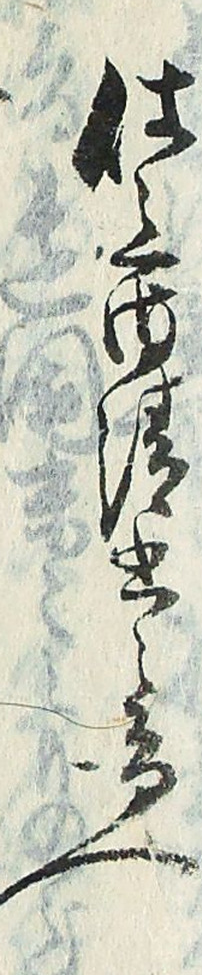仕上御請書之覚
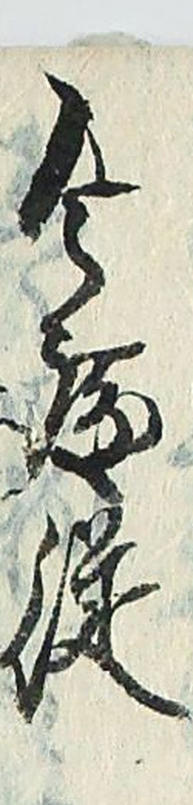今度従
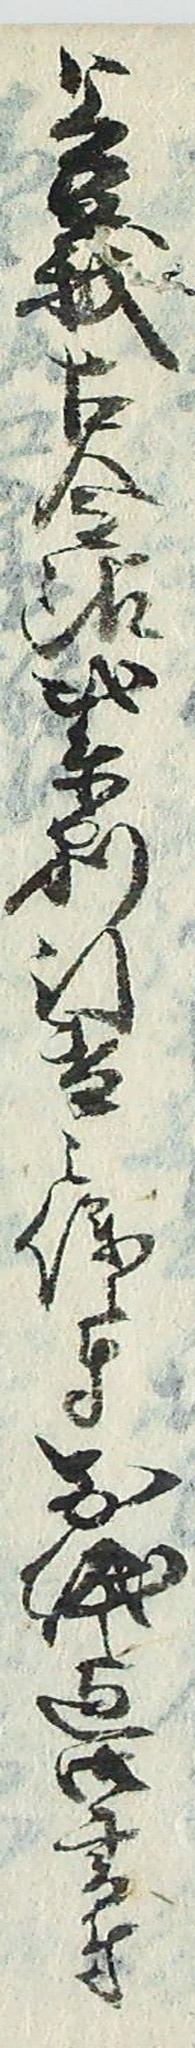公義古金銀弐朱判引替之儀に付別紙之通御書付
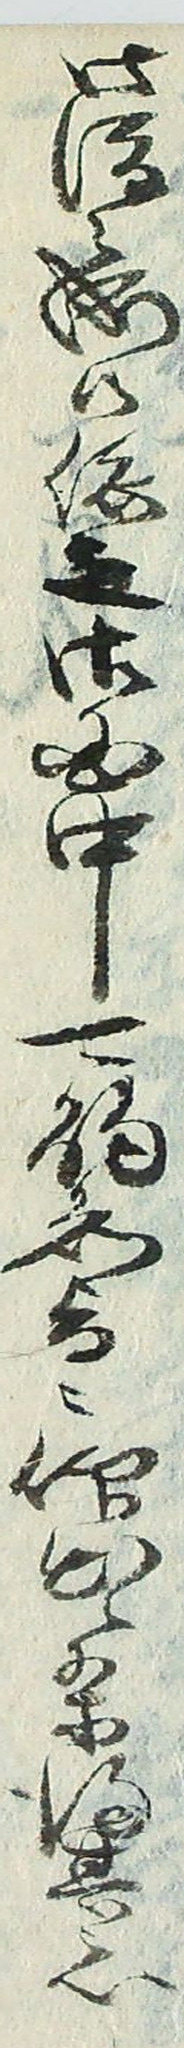御渡被成候依之御国中可触知旨被仰出候条得其意
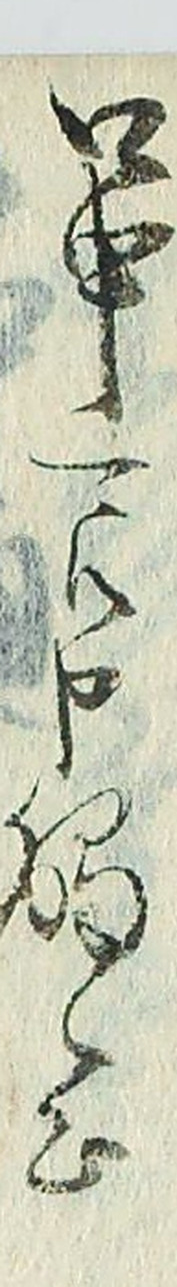郷中可被申触候以上
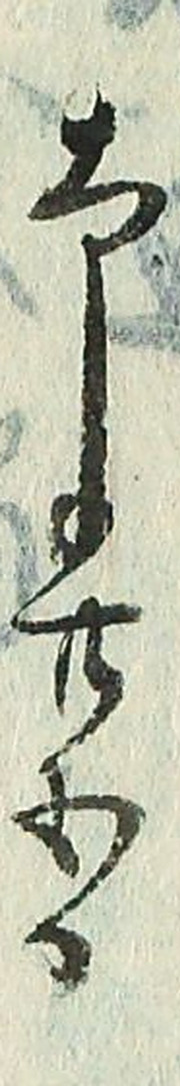十一月廿五日
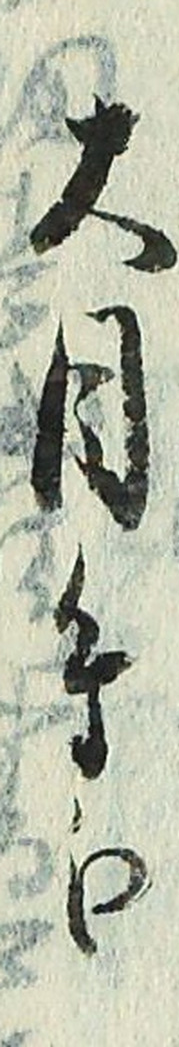大目付江
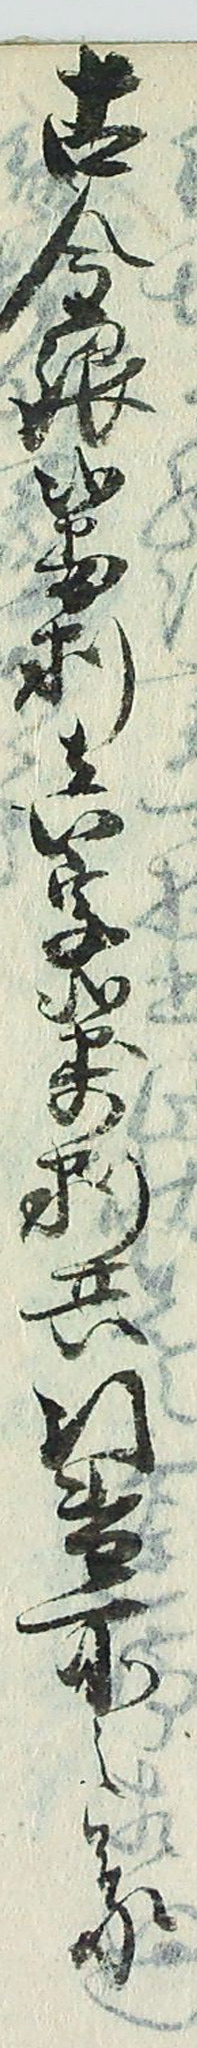古金銀弐歩判真字弐歩判共引替所之義
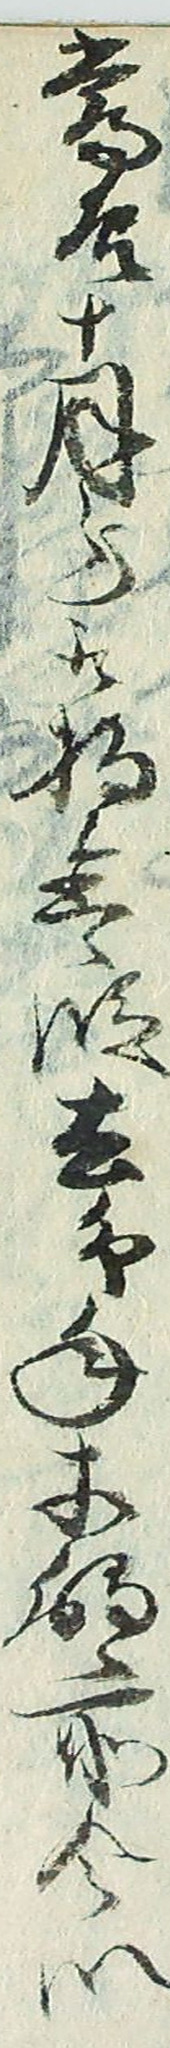当辰十月迄取指置候段去卯年相触候所今以
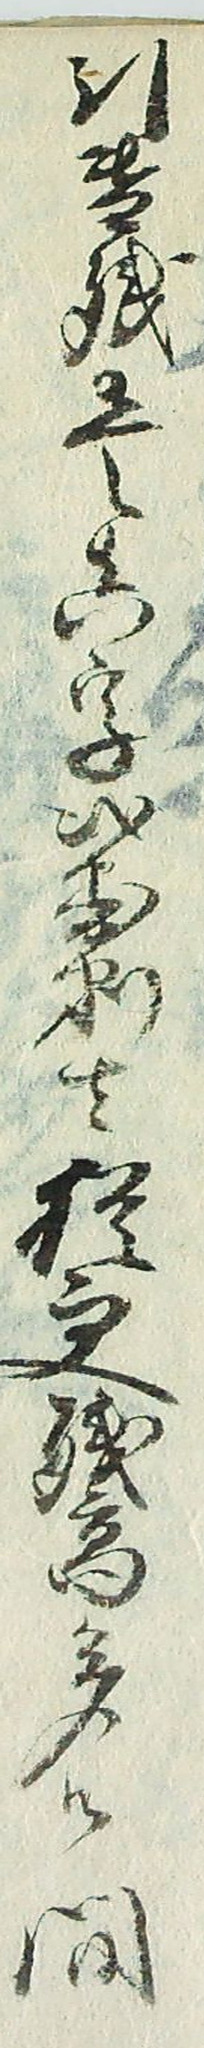引替残有之真字弐歩判は猶更残高多候間
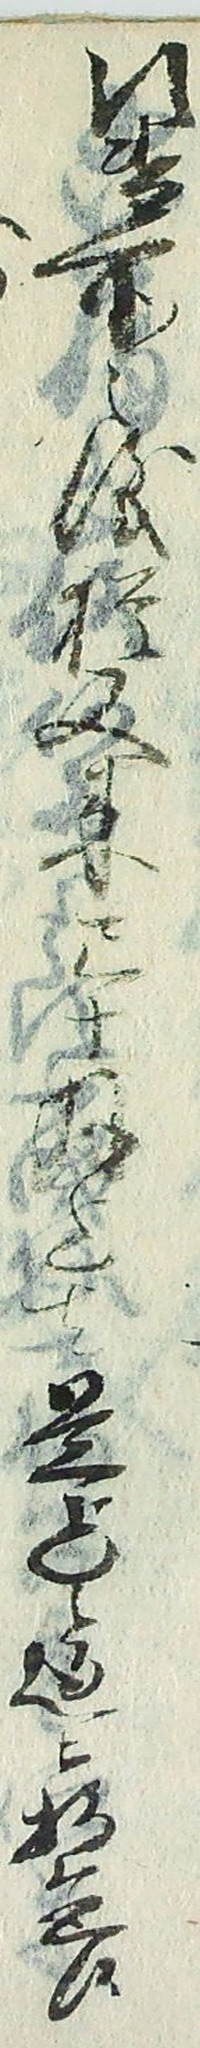引替所之義猶又来巳十月迄は是迄之通被指置候
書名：諸御用御□受書控
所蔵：鳴門教育大学 Naruto University of Education
